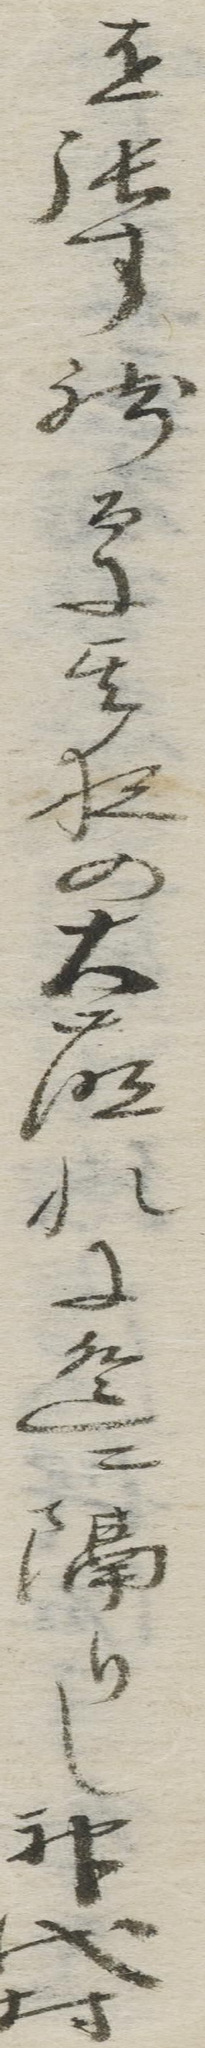を張す然るに其夜の大崩れに遥ニ隔りし神代村
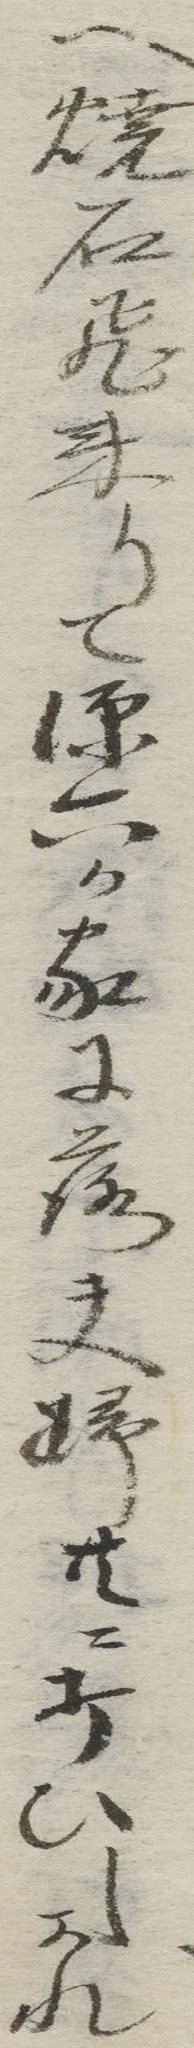へ焼石飛来りて源六か家に落夫婦共ニ打ひしかれ
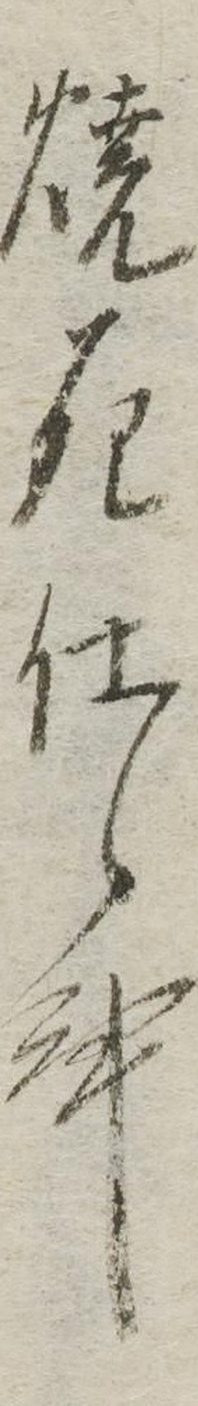焼死仕候事
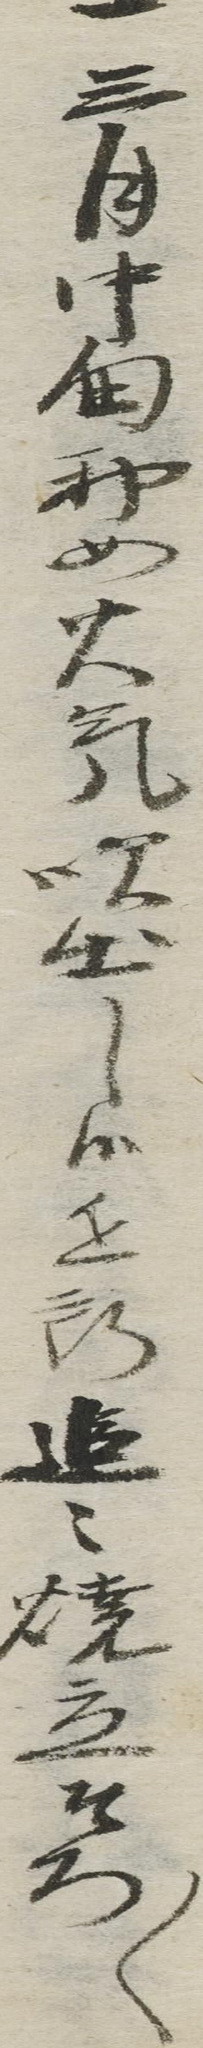一三月中旬初め火気吹出し候近所追〻焼立そろ〳〵
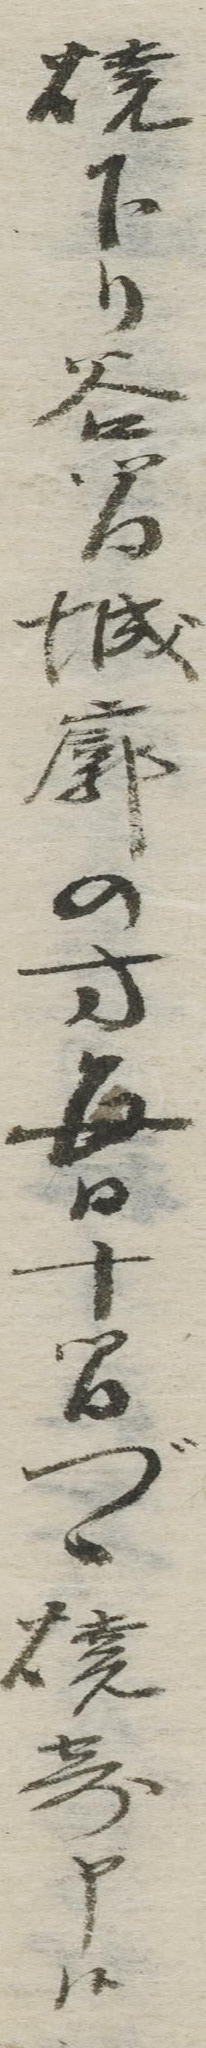焼下り谷間城郭の方毎日十間づゝ焼寄申候
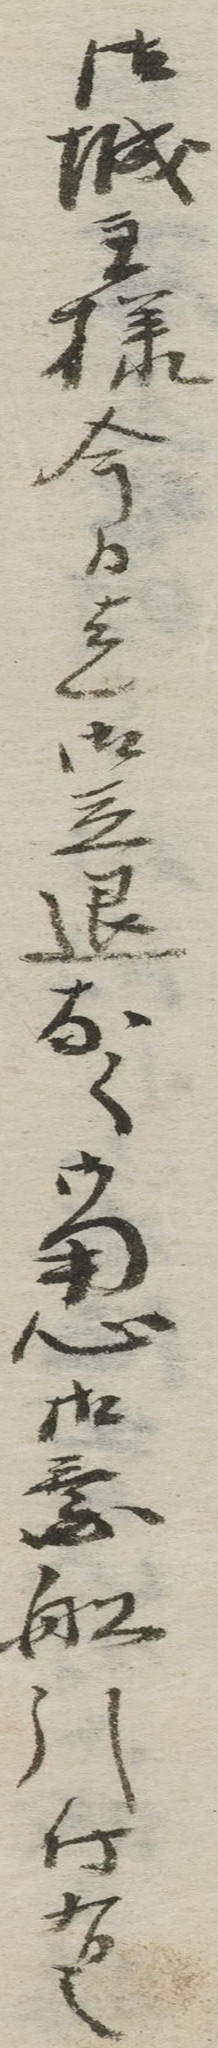一御城主様今日迄御立退なく御用心御乗舩引付有之
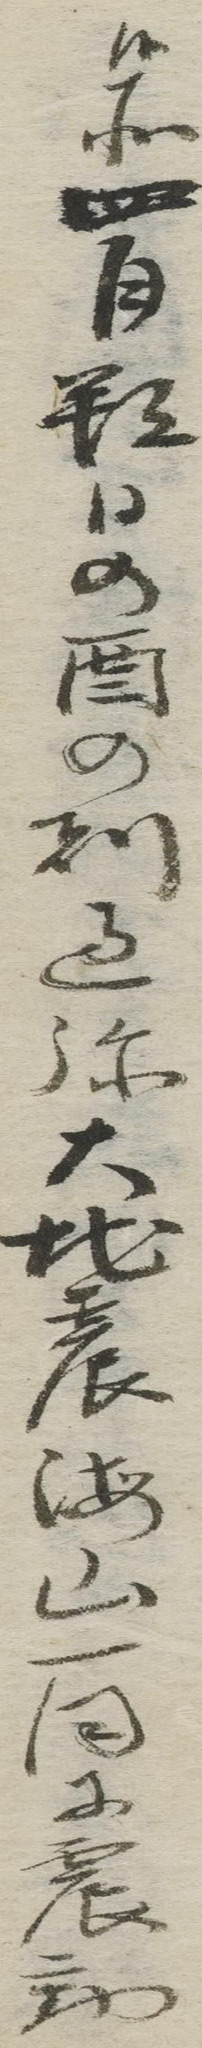候所四月朔日の酉の刻過弥大地震海山一同に震動

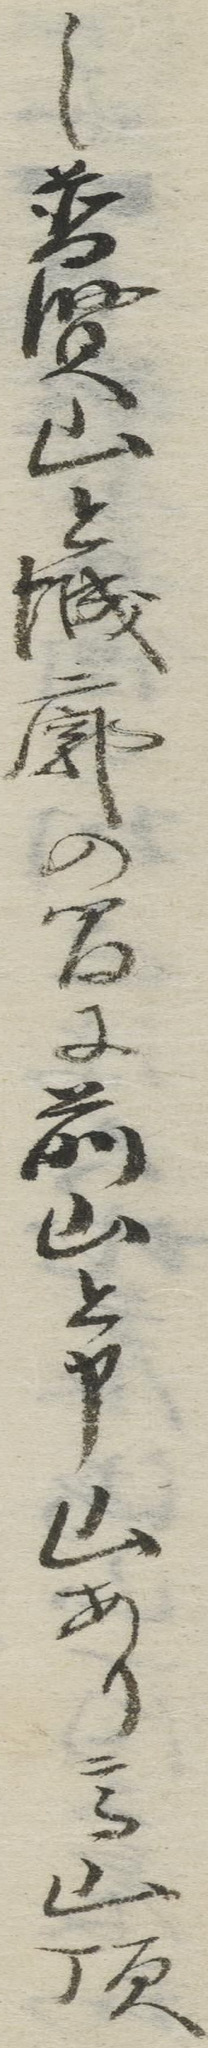之普賢山と城郭の間に前山と申山あり高山頂
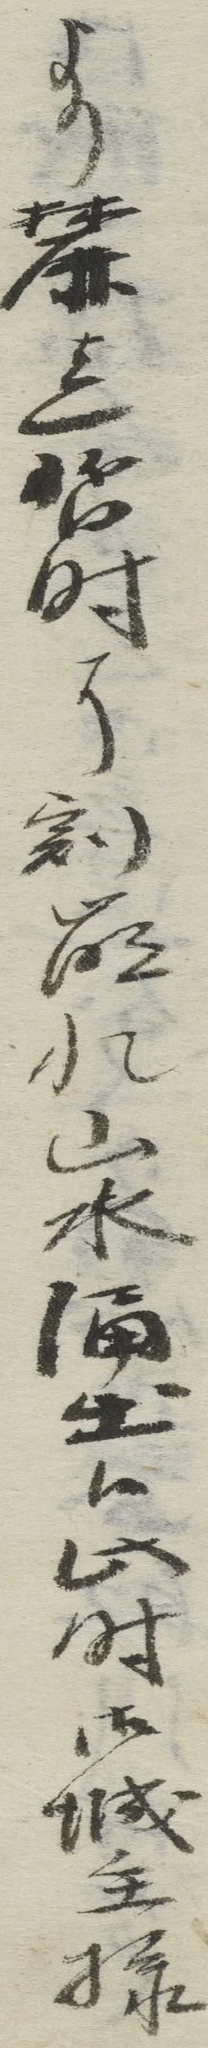より麓迄暫時に割崩れ山水涌出候此時御城主様
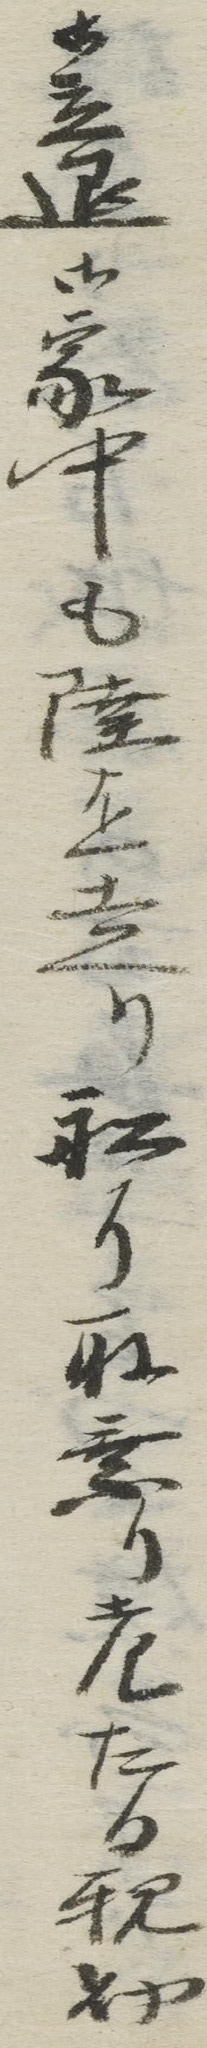御立退御家中も陸を走り船に取乗り老たる親幼
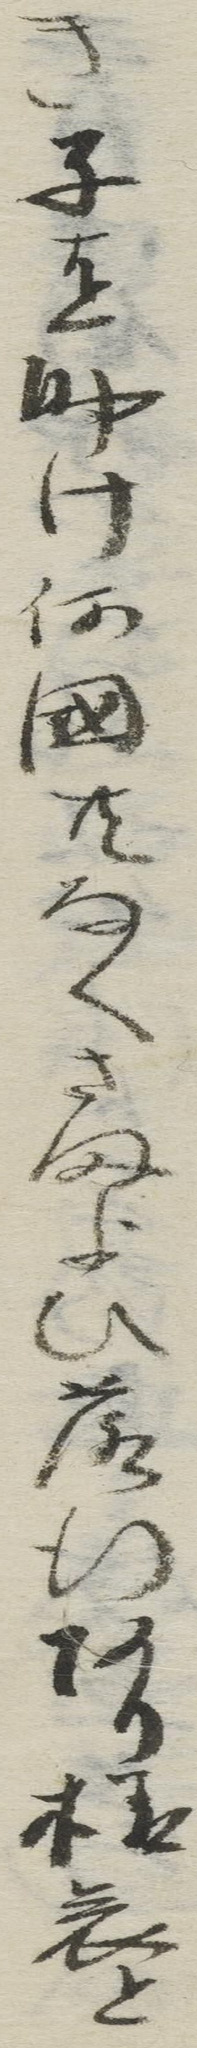き子を助け何国共なくさまよひ落行あり様哀と
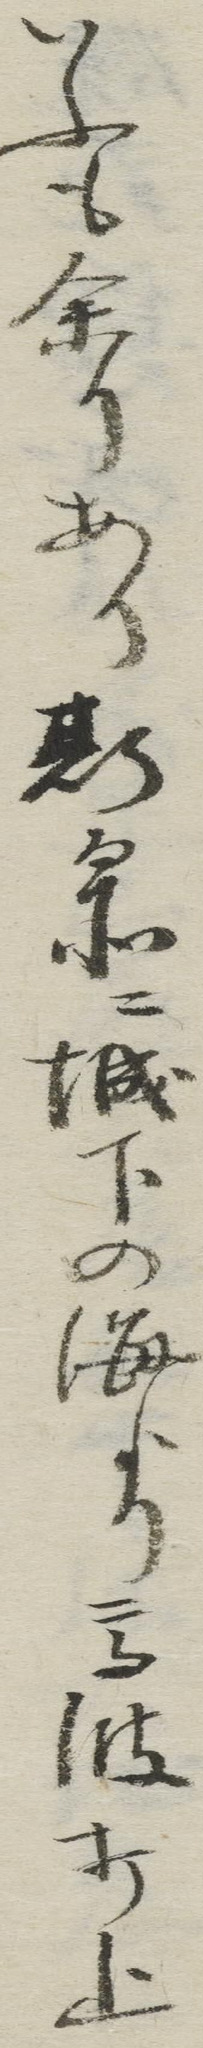いふも余りあり斯る所に城下の海より高波打上
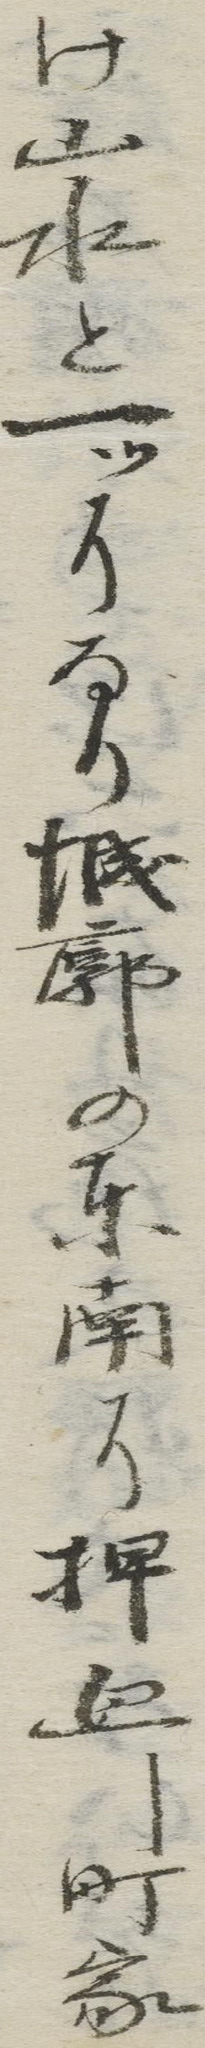け山水と一ツになり城郭の東南に押廻し町家
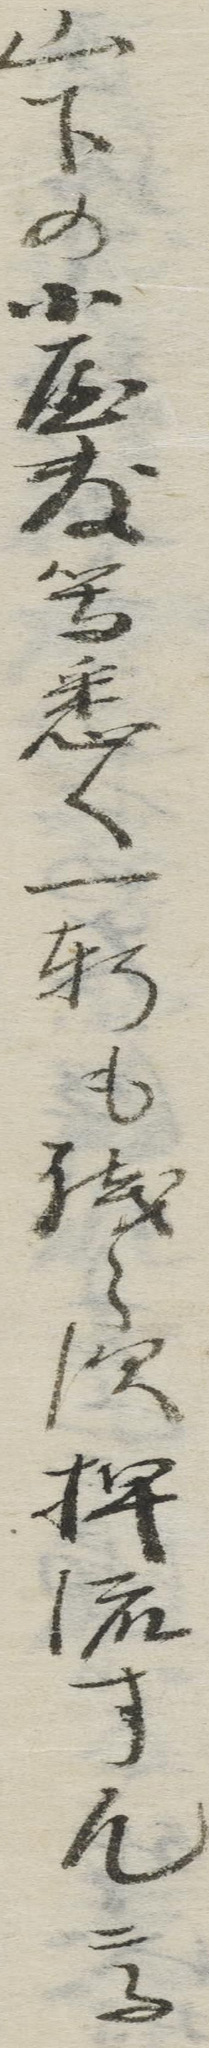山下の小屋敷等悉く一軒も残らす押流す也高
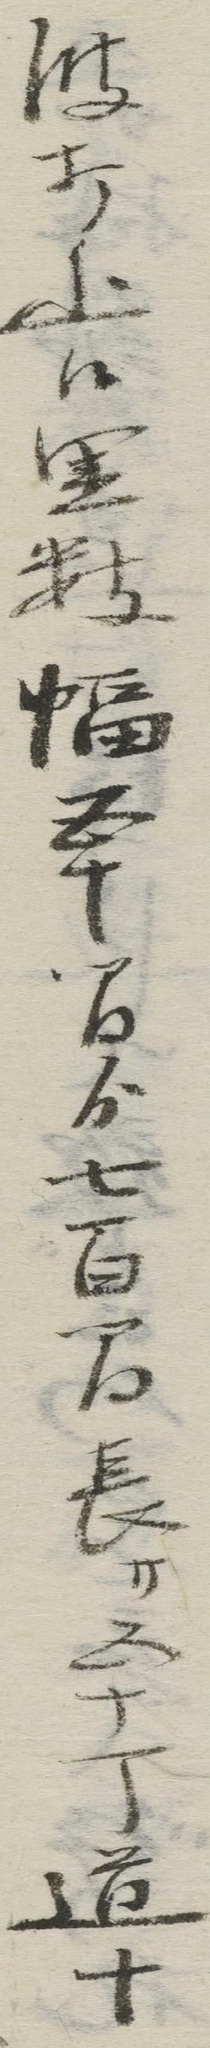波打上候里数幅五十間ゟ七百間長サ五十丁道十
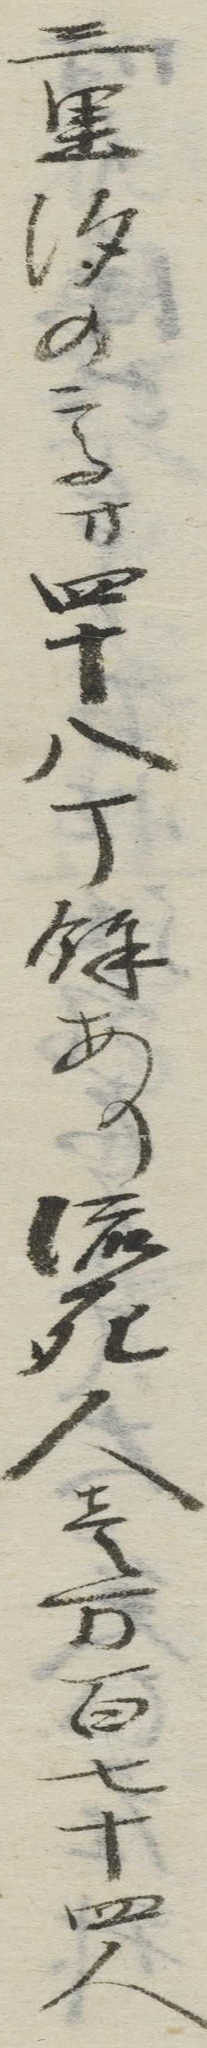三里汐の高サ四十八丁餘あり流死人壱万百七十四人
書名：肥前國島原領普賢山大変記　完
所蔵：東京大学地震研究所図書室 Earthquake Research Institute Library, The University of Tokyo, JAPAN
